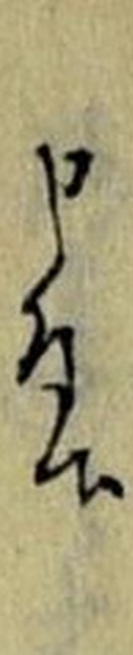申付候
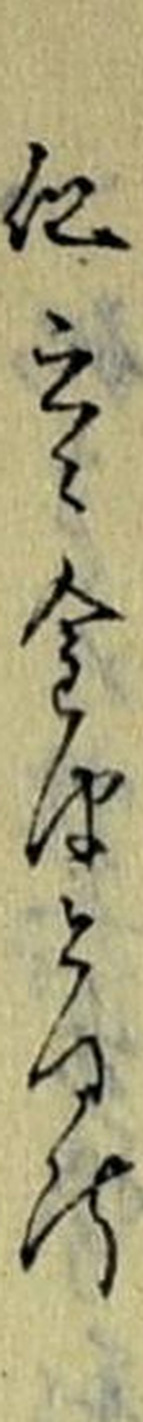但云々金津と同断
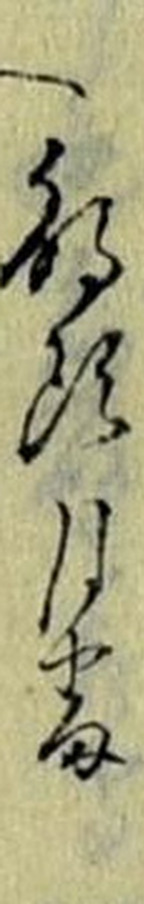触頭月番
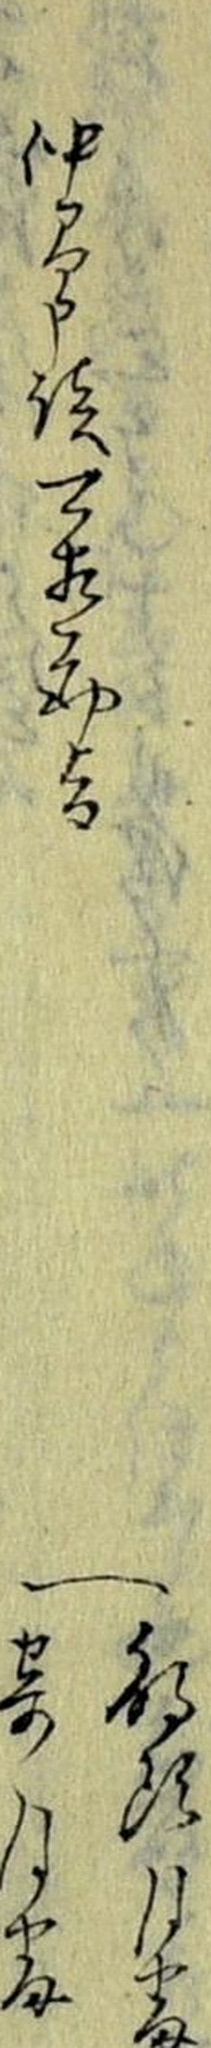仲間申談可相勤旨
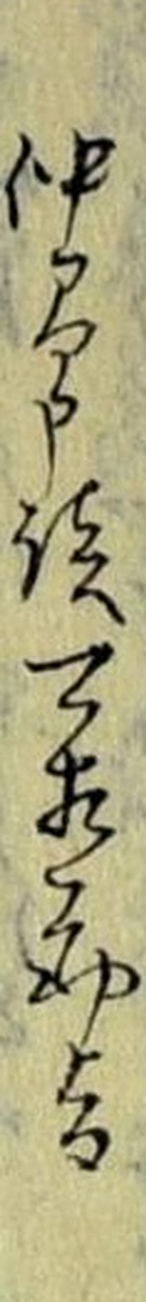仲間申談可相勤旨
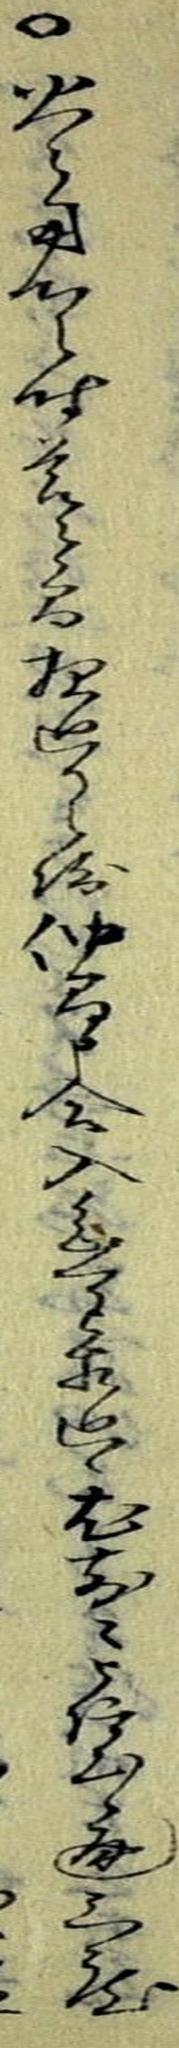〇火之用心之時節之間夜廻之儀仲間申合入念可被相廻候尤前々被仰出候通三度
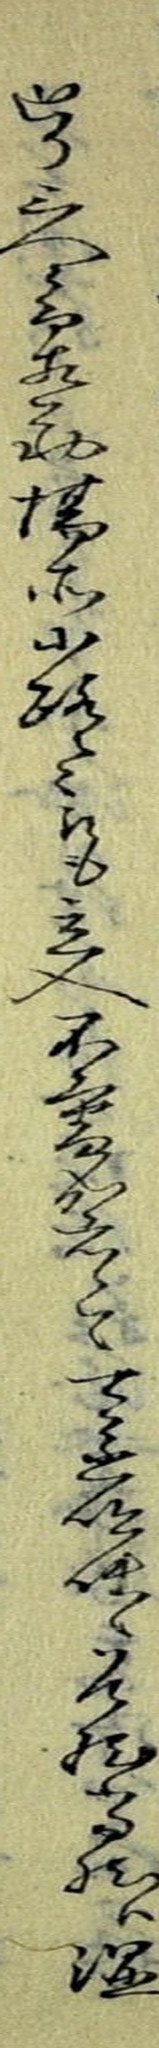廻り三人に而相勤場所小路々々えも立入不審成者候はゝ可遂吟味候乍然当然は湿
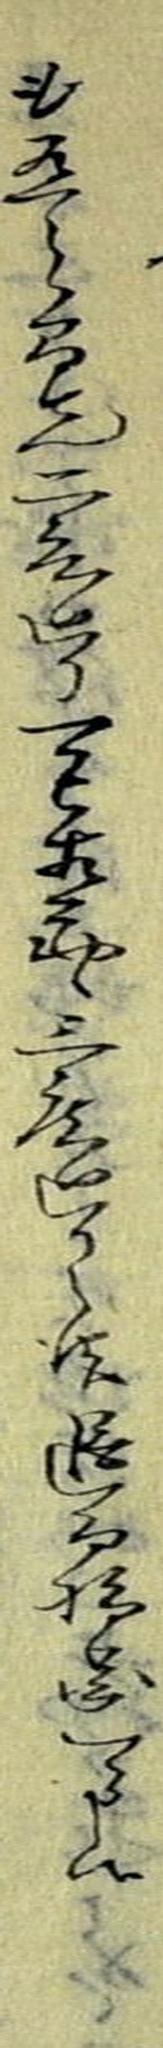も有之間先二度廻り可被相勤候三度廻り之儀は追而指図可申候
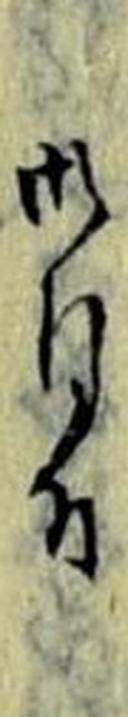御目付
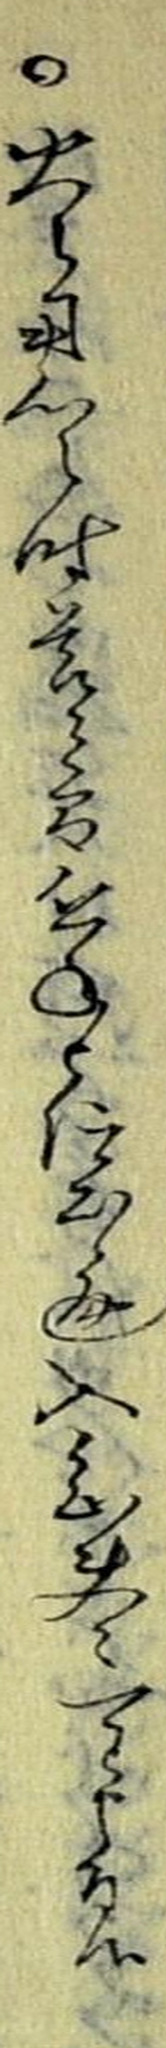〇火之用心之時節ニ候間近年被仰出候通入念夫々可被申付候
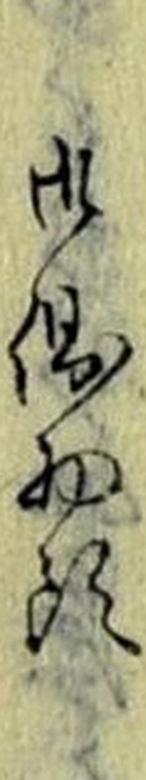御側物頭
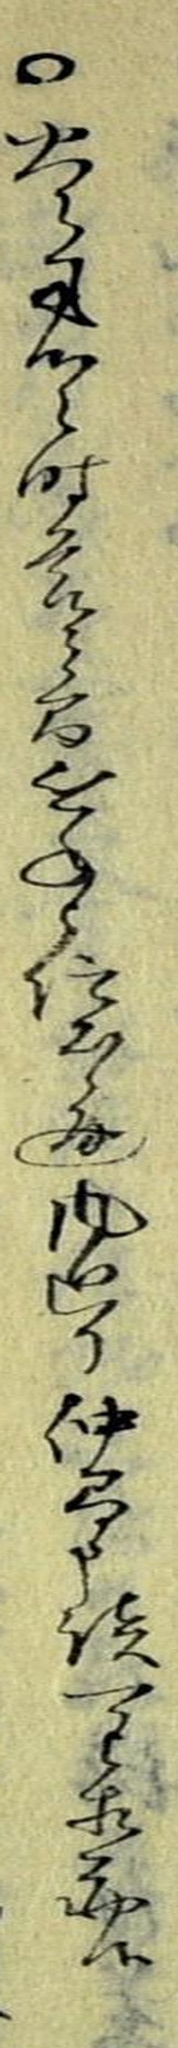〇火之用心之時節ニ候間近年被仰出候通風廻り仲間申談可被相勤候
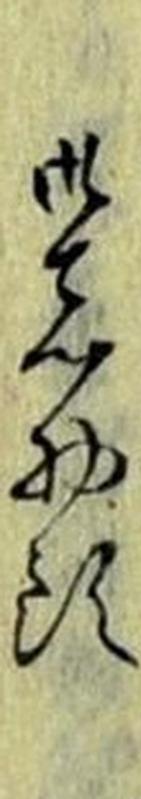御側物頭
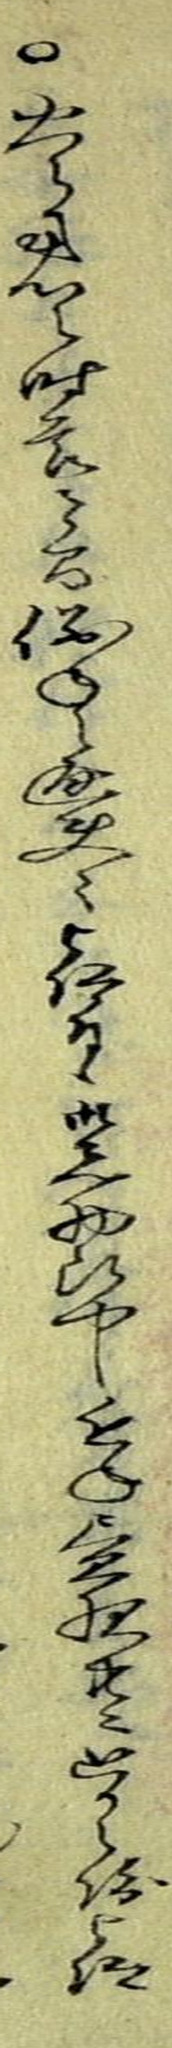〇火之用心之時節之間例年之通夫々被仰付候御先物頭中近年昼夜共に廻り之儀被仰
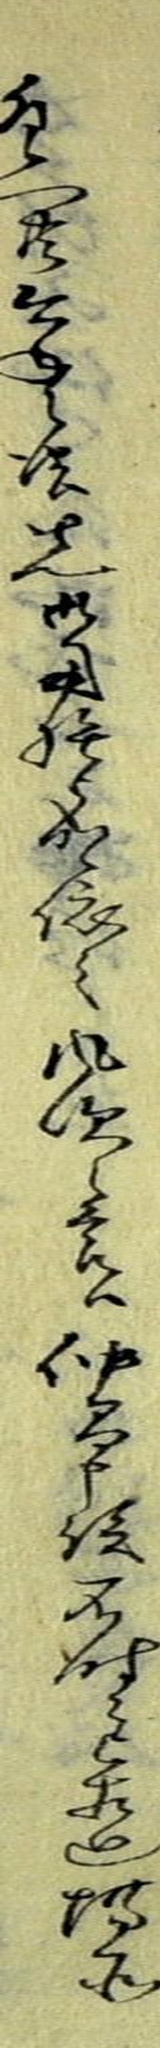付候へ共今年之儀は先御用捨被成候依之風吹之節は仲間申談不時に被相廻場所
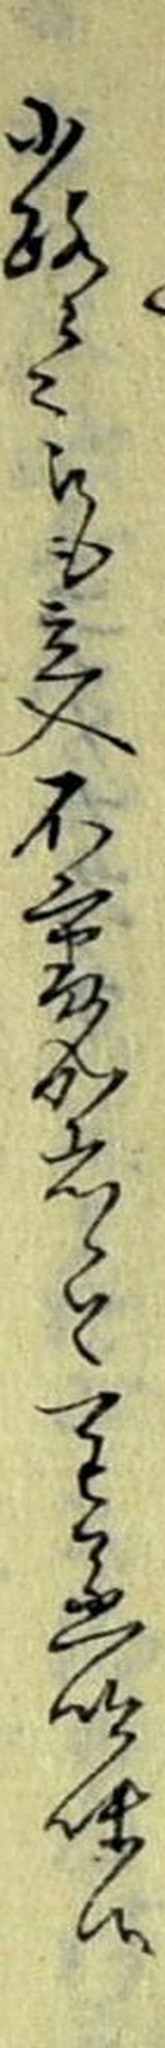小路々々えも立入不審成者候はゝ可被遂吟味候
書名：命令之部 六
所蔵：福井県文書館 Fukui Prefectural Archives
